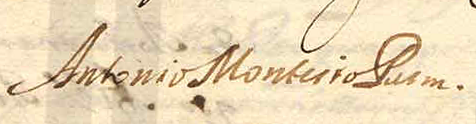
Antonio Monteiro Paim.
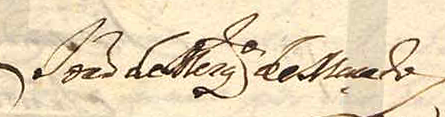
Ioaõ de Mesq.ta de Maçado
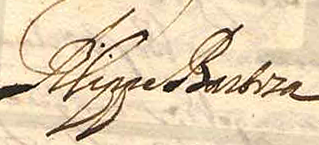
Filippe Barboza
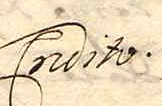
Credito.
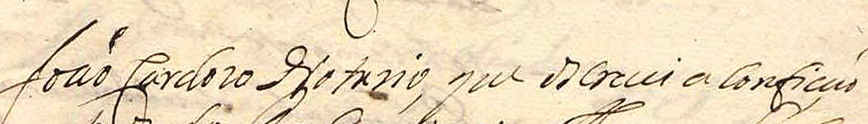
Joaõ Cardozo Notario, que escreui a Confiçaõ
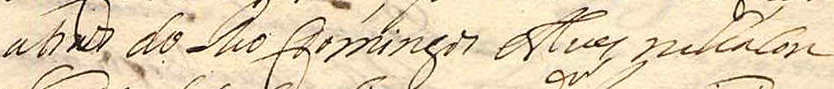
atras do Reo Domingos Alues nella con
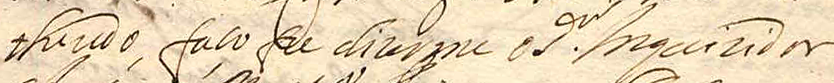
theudo, faço fee dizer me o s.or Inquizidor
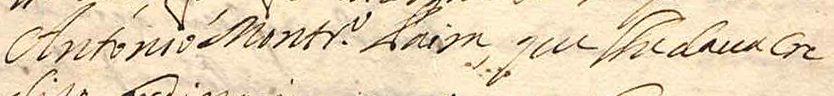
Antonio Montr.o Paim, que lhe daua cre
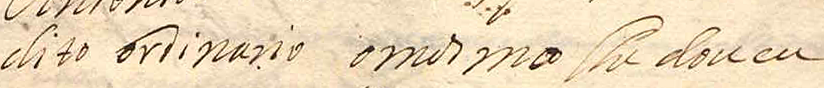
dito ordinario o mesmo lhe dou eu
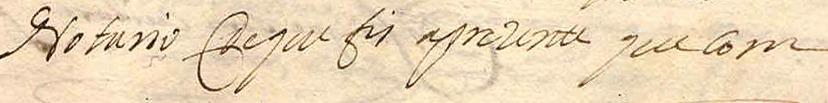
Notario De que fis a prezente que com
